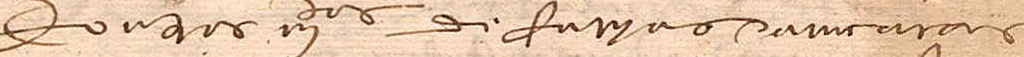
E outras mtas de furyas e ameacas
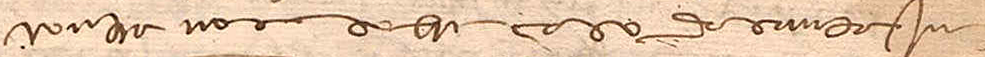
contra nos sobre caso da santa Jm
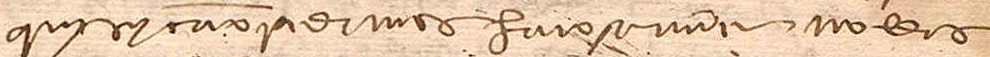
qujsyção pedimos ha uosa mēçe nollas
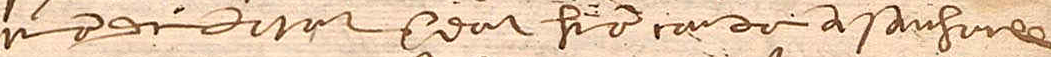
māde tirar e dar huā carta testenhauell
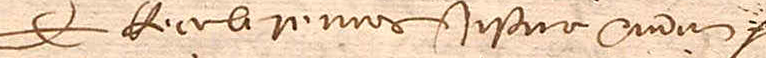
E Reçeberemos Justica e m̄çe /
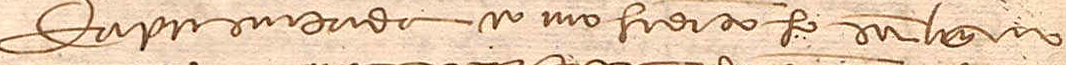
E apresentada como he dito ho s̄or vigro
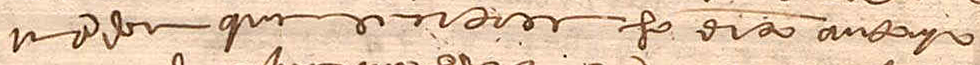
mādou que se citase ho dito antonjo
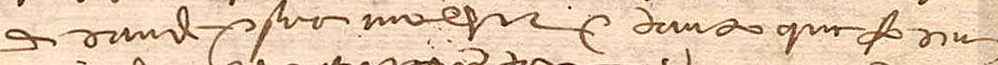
de sande e sua molher e tanto que fosem
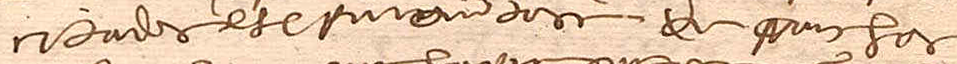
citados lhe pergūtase Eu sp̄am has
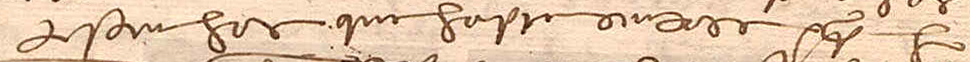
testemhas que hapresentase e p̄o ho
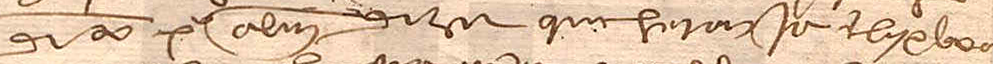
dito po āluz dizer que heram Ja ē lyxboa
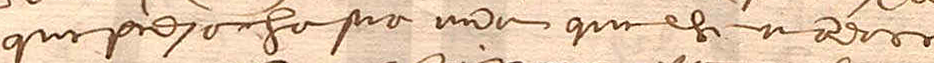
que pedja ha sua mēçe que lhe mādase
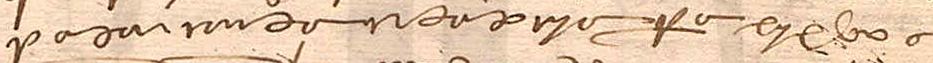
pasar carta citatorya ꝑa lyxboa
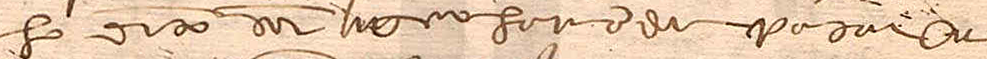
ho dito s̄or vigro ha mādou pasar eu
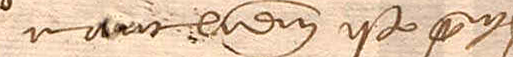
manoel d̄iz esto sp̄uy
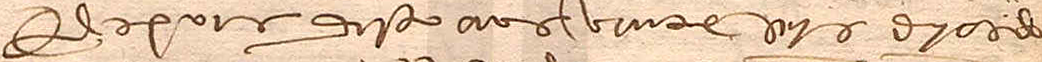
E despois desto aos vinte sejs dyas do
